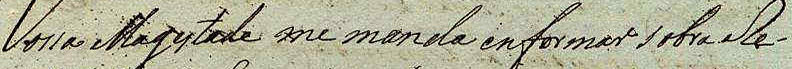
Vossa Magestade me manda enformar sobre a Re
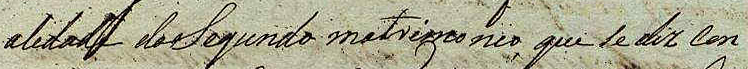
aledade do Segundo matrimonio que se diz con
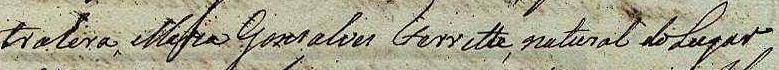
trahera Maria Gonsalves Ferrette, natural do Lugar
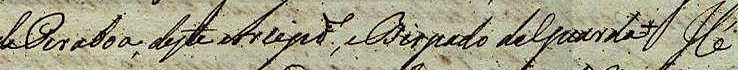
de Peraboa, deste Arcipd.o, e Bispado da Guarda = Hé
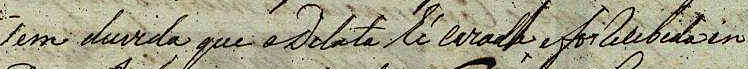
sem duvida que a Delata hé cazada e foi Recebida in
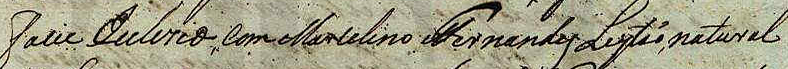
facie Ecclezio, com Marcelino Fernandes Leytaõ, natural
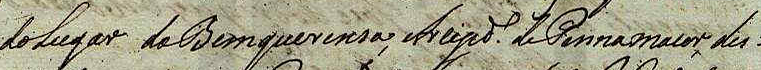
do Lugar de Bemquerensa, Arcipd.o de Pennamacor, des
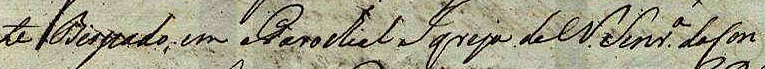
te Bispado, em Parochial Igreja de N. Senr.a da Con
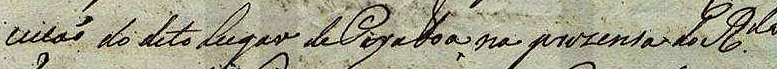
ceicaõ do dito Lugar de Peraboa, na prezensa do R.do
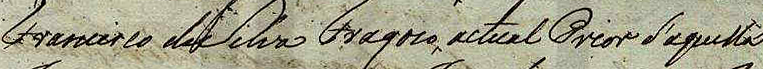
Francisco da Silva Fragozo, actual Prior d'aquella
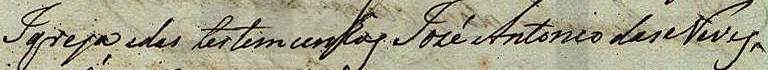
Igreja, e das testemunhas Iozé Antonio das Neves,
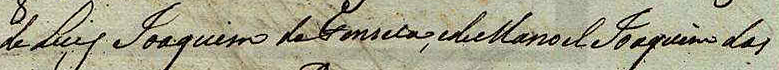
de Luis Ioaquim da Fonseca, e de Manoel Ioaquim das
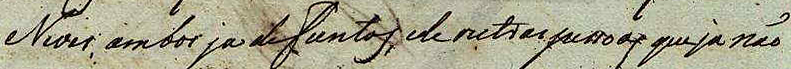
Neves, ambos ja defuntos, e de outras pessoas que ja não
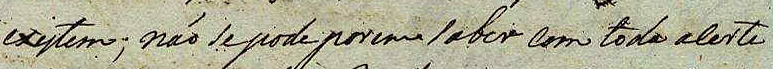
existem; naõ se pode porem saber com toda a certe
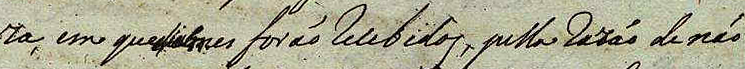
za, em que dia e mes foraõ Recebidos, pella Razaõ de não
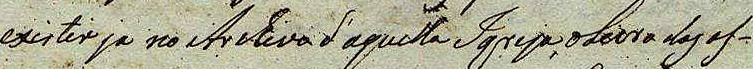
existir ja no Archivo d'aquella Igreja, o Livro dos as
